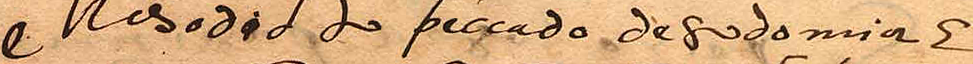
elles o dicto peccado de sodomia E
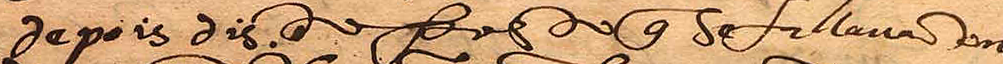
depois disto posto q̄ se fallauão on
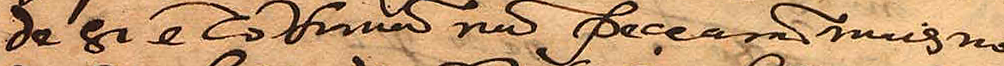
de se ēcōtrauão naõ peccarão mais no
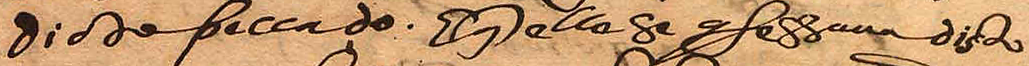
dicto peccado. E q̄ elle se ꝯfessaua disto
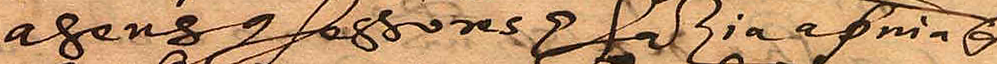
a seus ꝯfessores E fazia a p̄nia q̄
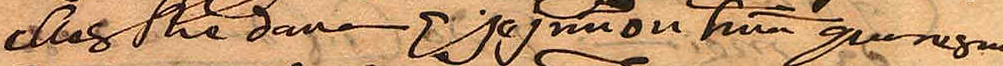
elles lhe daua E jejūuou hūa quaresma
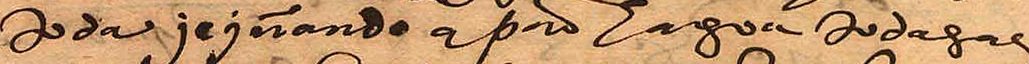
toda jejūando a pão E agoa todas as
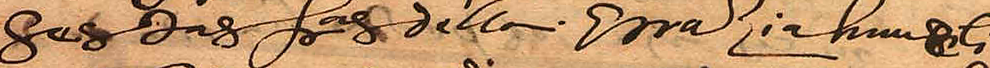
sestas fras della. E trazia hūu sili
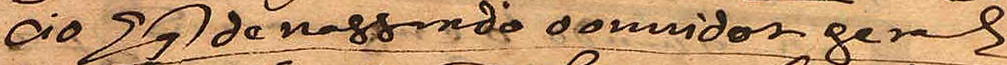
cio E q̄ deuassando o ouuidor geral
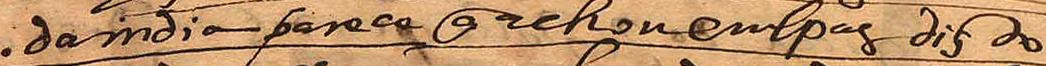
da india parece q̄ achou culpas disto
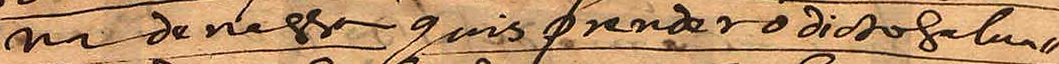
na deuassa quis prender o dicto salua
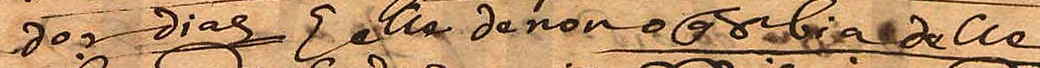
dor dias E elle de nouo q̄ sabia delle
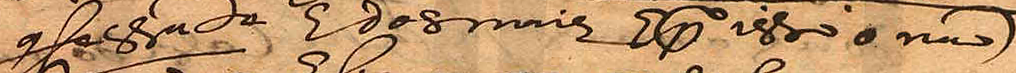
ꝯfessāte E dos mais E p̄o isso o não
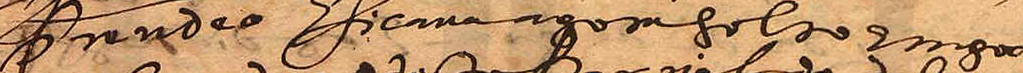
prendeo E ficaua agora solto Em goa
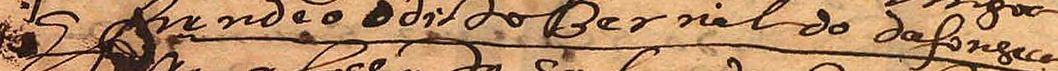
E prendeo o dicto Bernaldo da fonseca
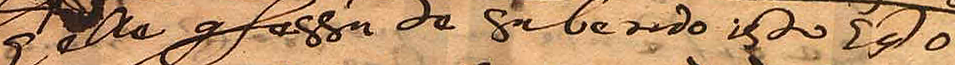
E elle ꝯfessāte sabendo isto E q̄ o
